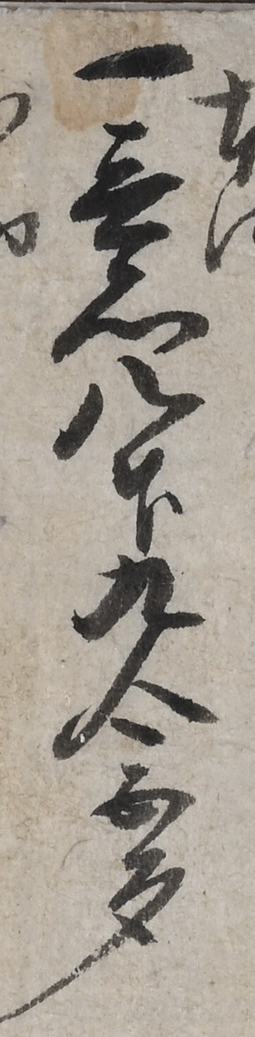一壱石八升三合八夕
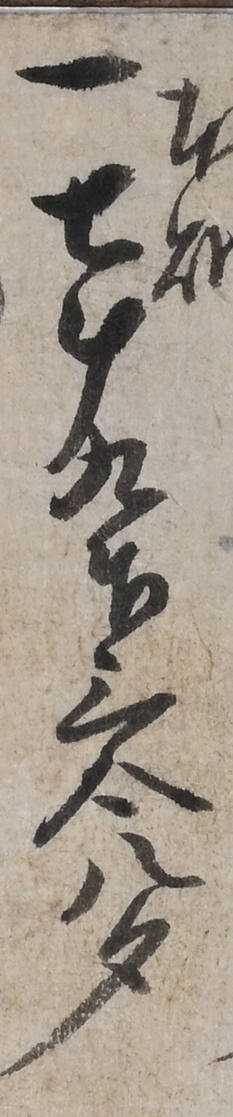一七斗九升三合八夕
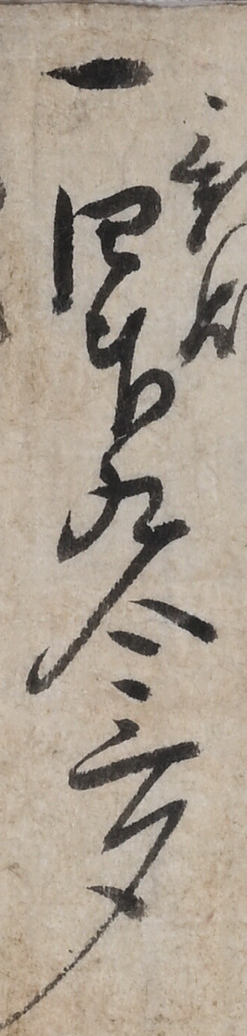一四斗九合三夕
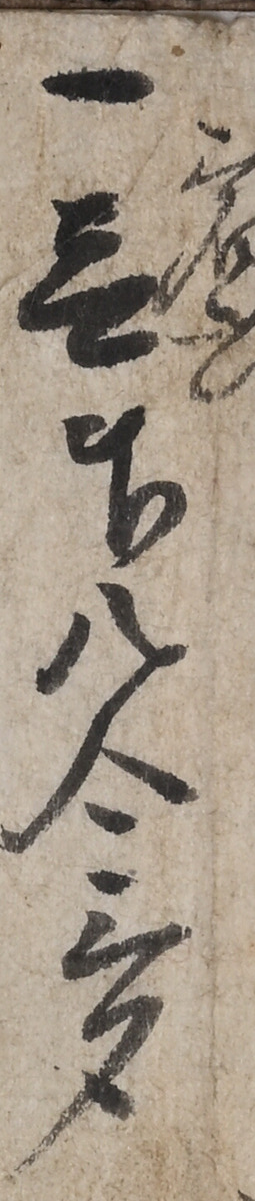一壱斗八合三夕
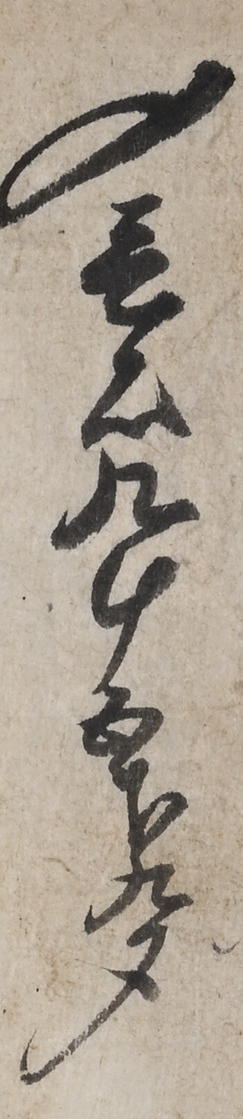〆壱石九斗五升九夕
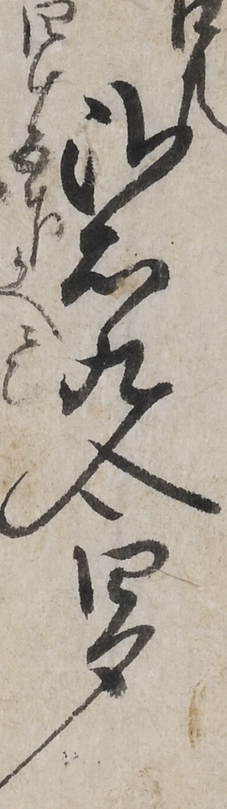弐石九合四夕
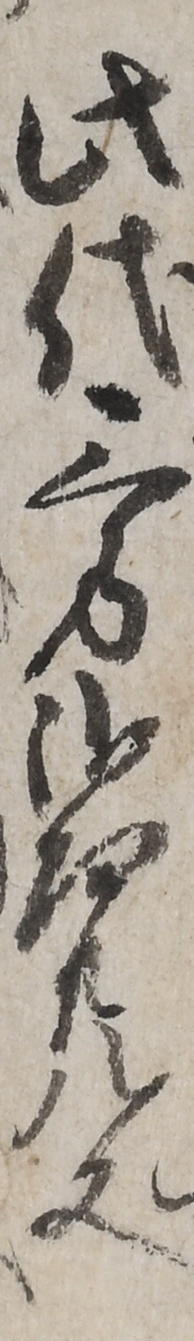此代三分弐百廿八文
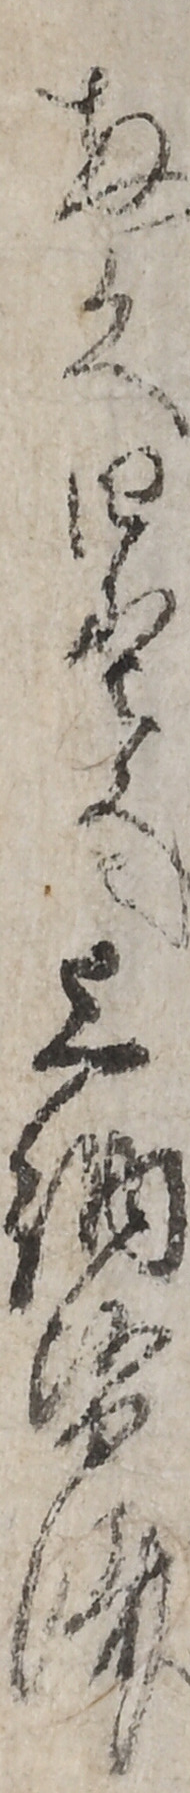両かへ四貫文也上納皆済
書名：野口村持高覺帳
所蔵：伊那市立高遠町図書館・合同会社AMANE
